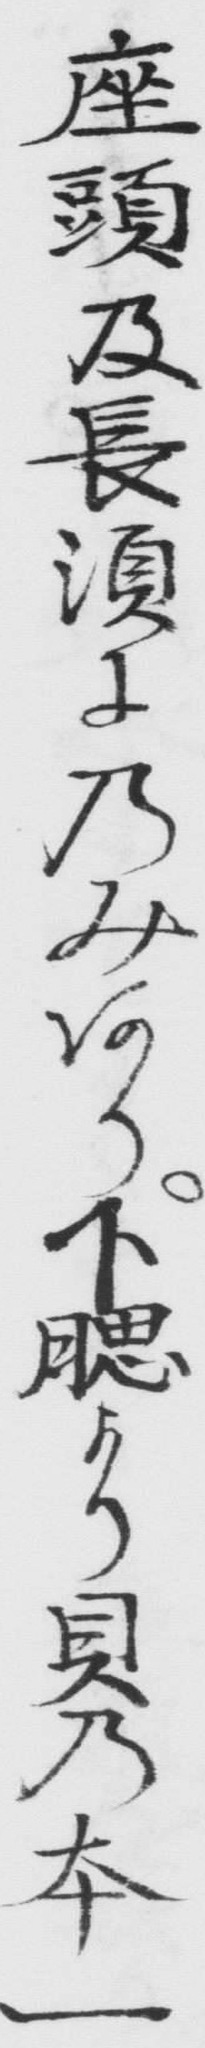ウネ座頭及長須にのみあり。下腮より貝の夲一
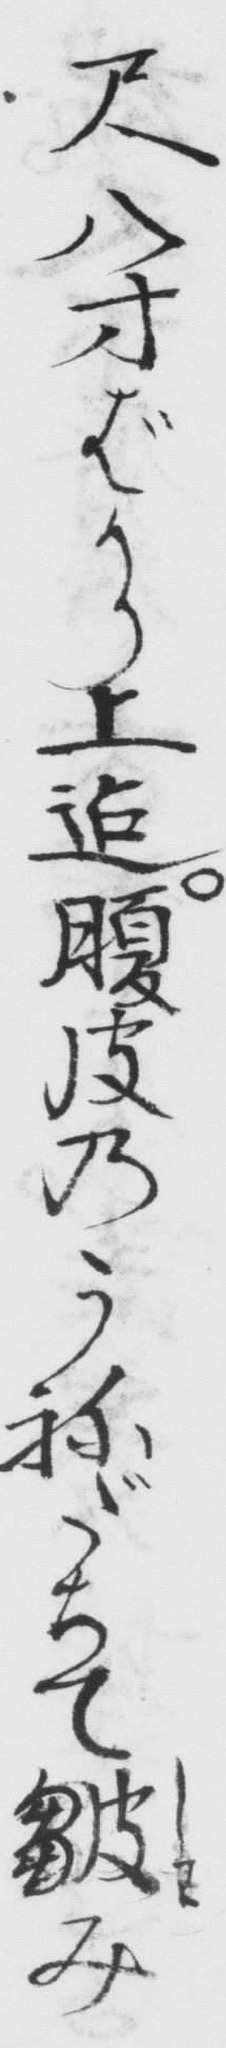尺八寸ばかり上迄。腹皮のうねがちて皺み
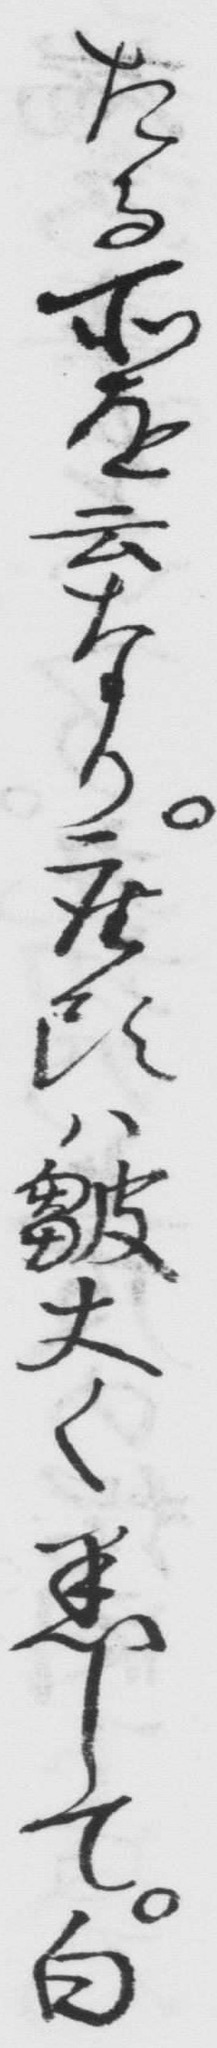たる所を云なり。座頭は皺大く黒にて。白
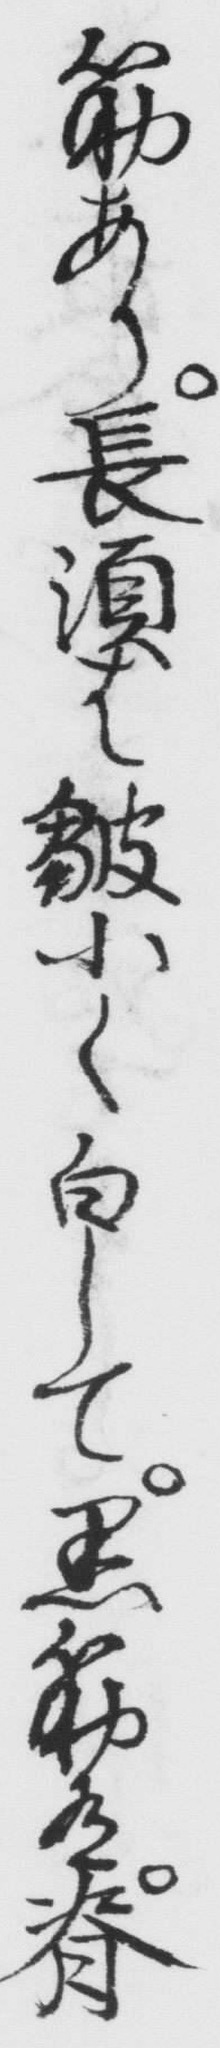筋あり。長須は皺小く白にて。黒筋有。背
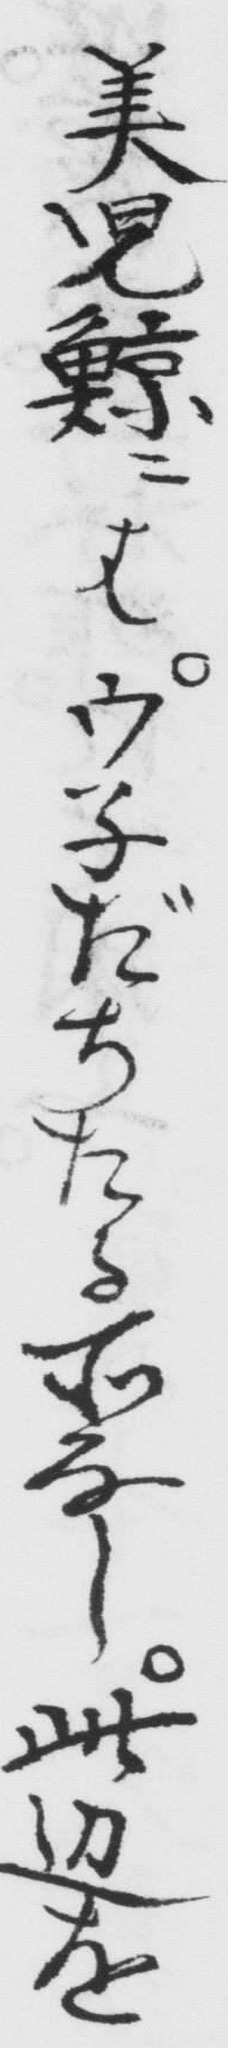美児鯨には。ウネだちたる所なし。此辺を
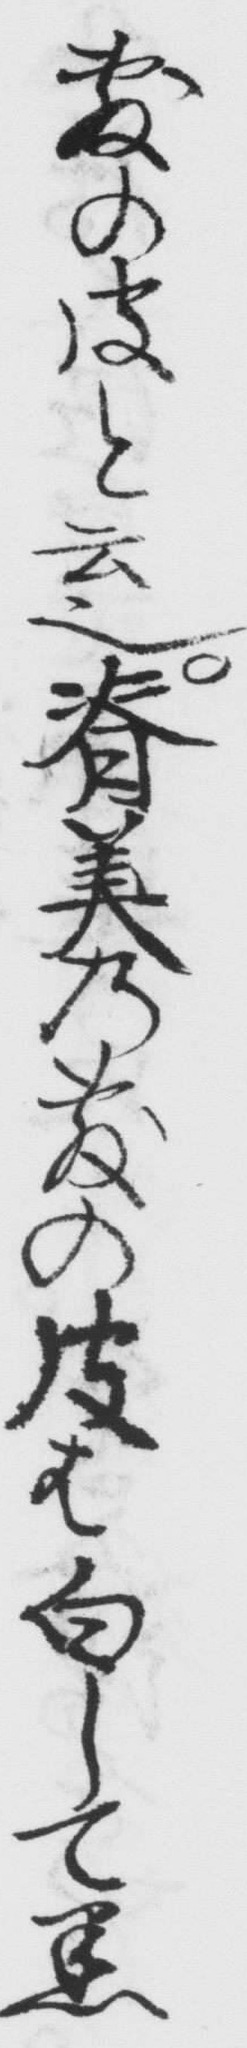敷の皮と云也。背美の敷の皮は白にて黒
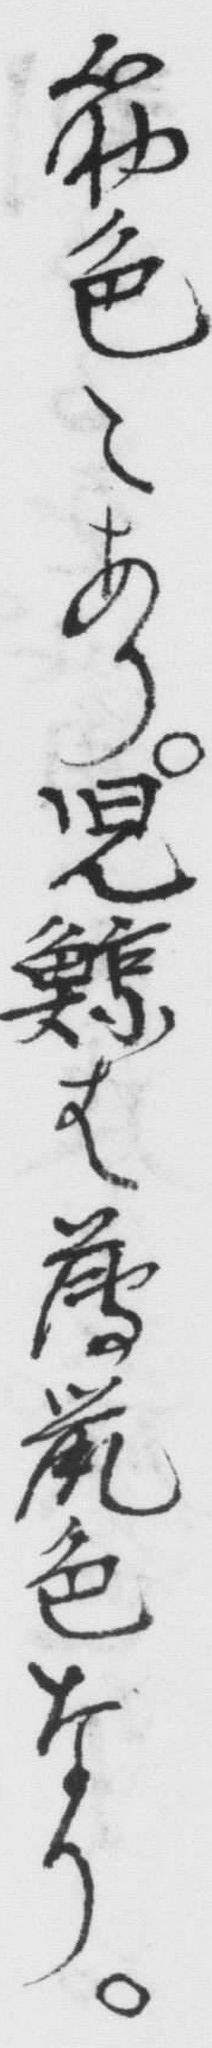筋色々あり。児鯨は薄鼠色なり。
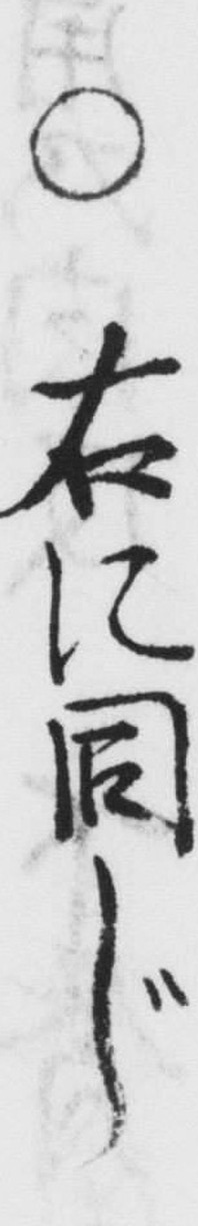○右に同じ

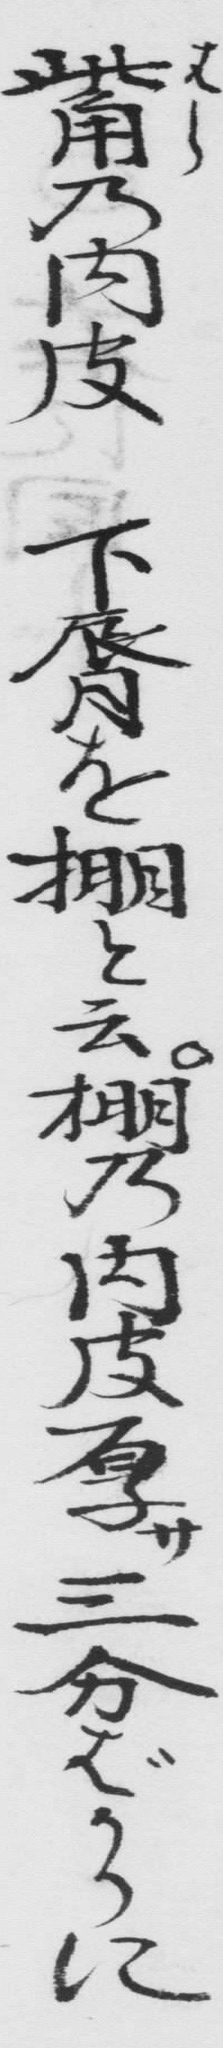觜の内皮下脣を棚と云。棚の内皮厚サ三分ばかりに
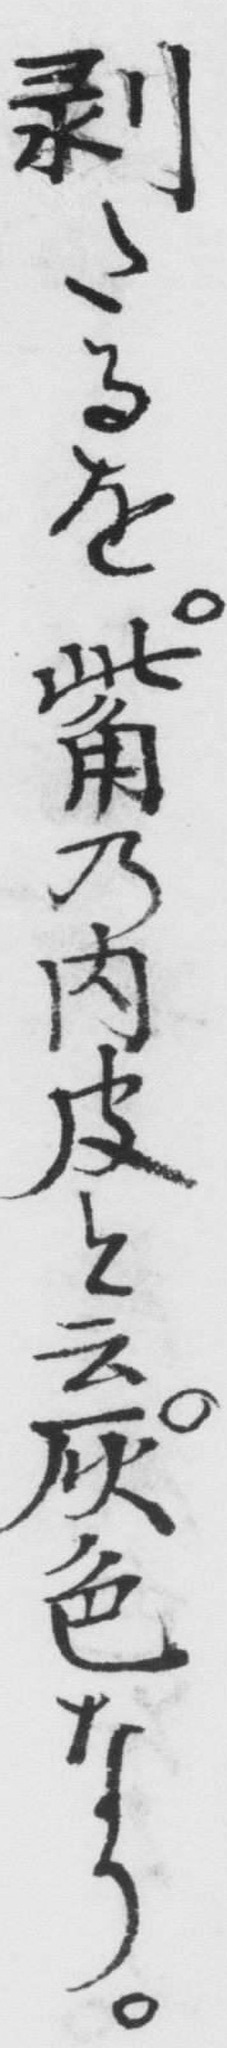剥たるを。觜の内皮と云。灰色なり。
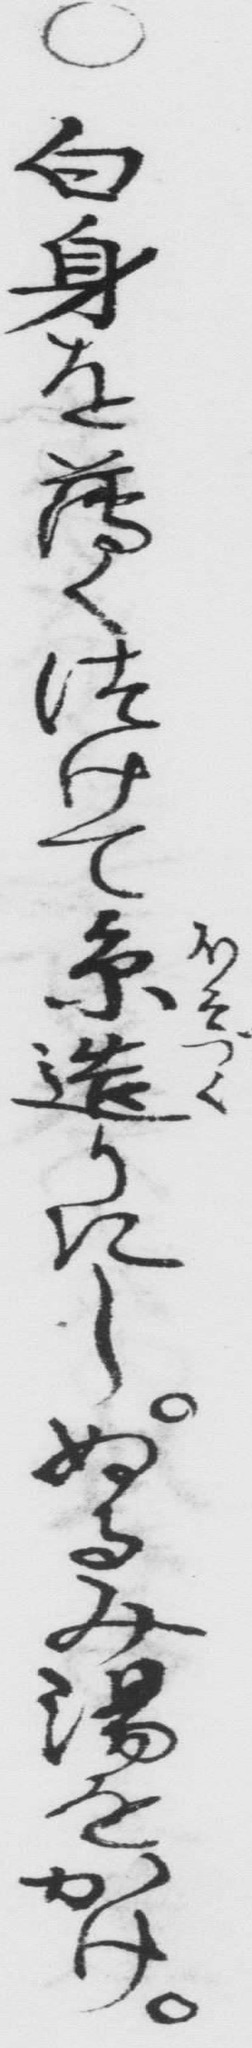○白身を薄くつけて糸造りにし。ぬるみ湯をかけ。
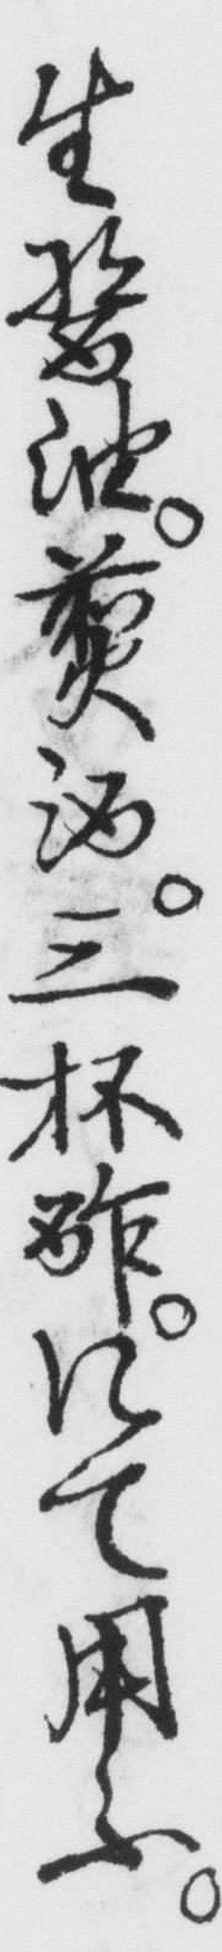生醤油。煎酒。三杯酢。にて用いふ。
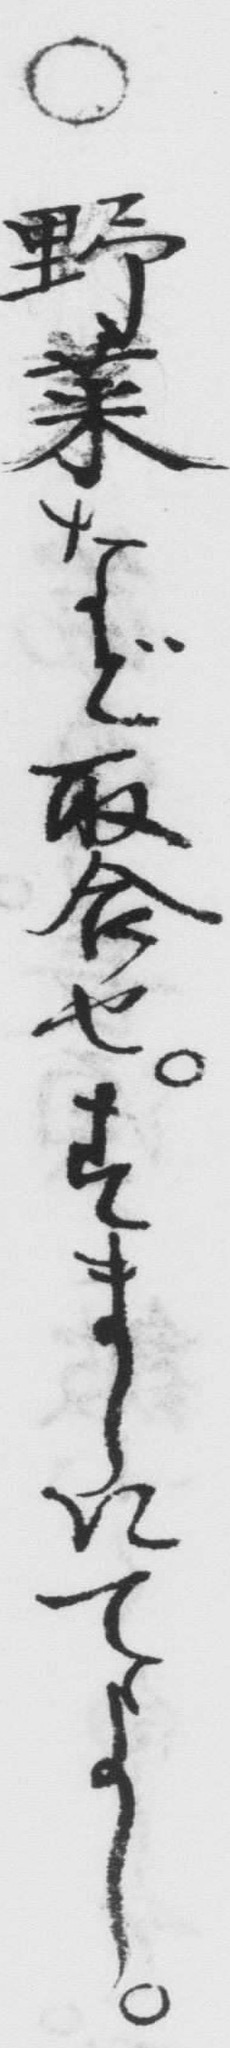○野菜など取合せ。すましにてよし。
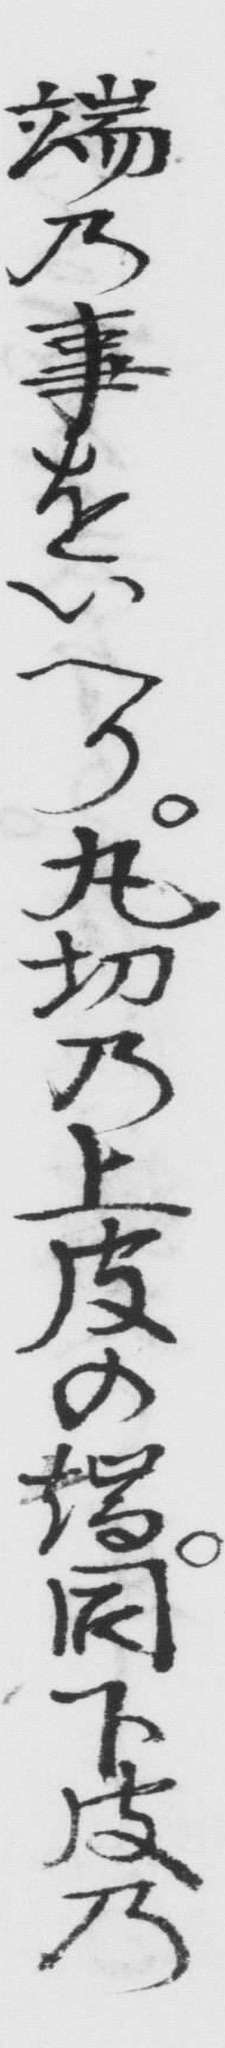耳端の事をいへり。丸切の上皮の端。同下皮の
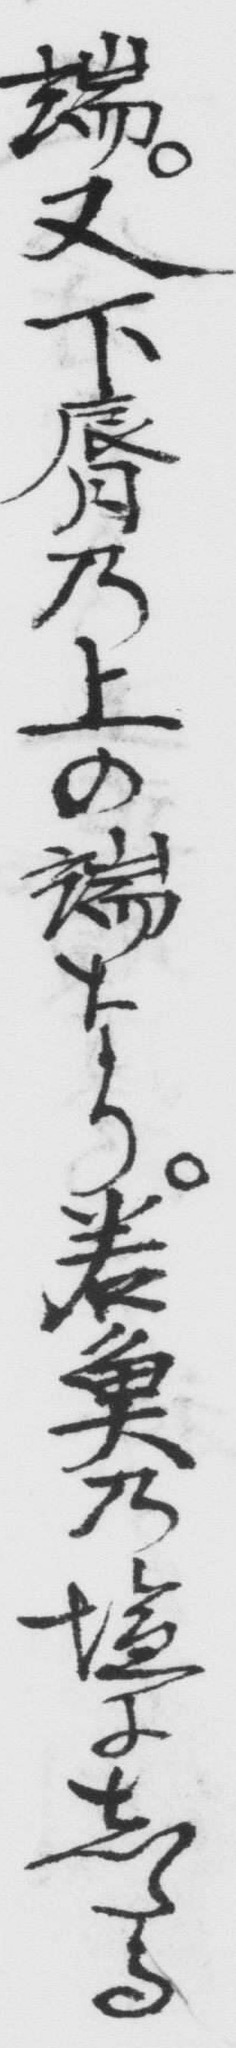端。又下脣の上の端なり。若魚の塩にしたる
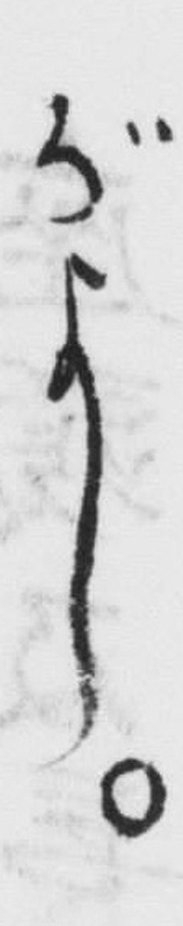がよし。
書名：鯨肉調味方
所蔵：大阪府立大学学術情報センター 国文学研究資料館
